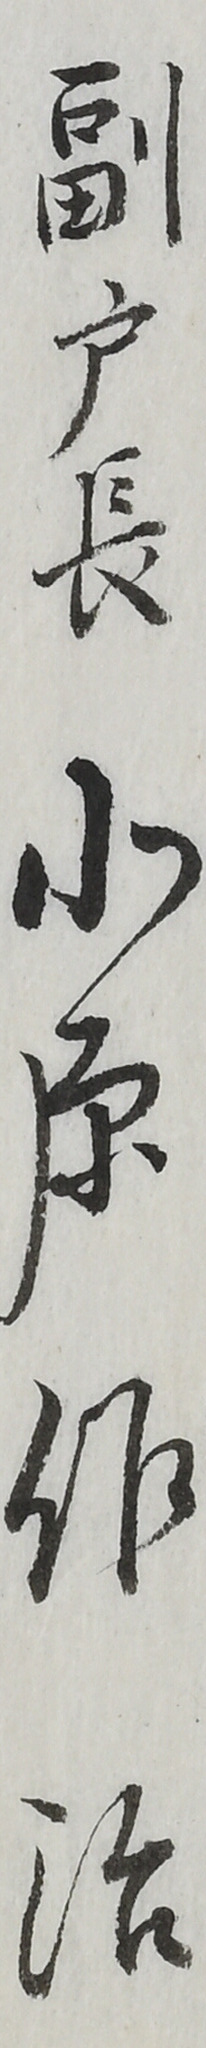副戸長小原作治
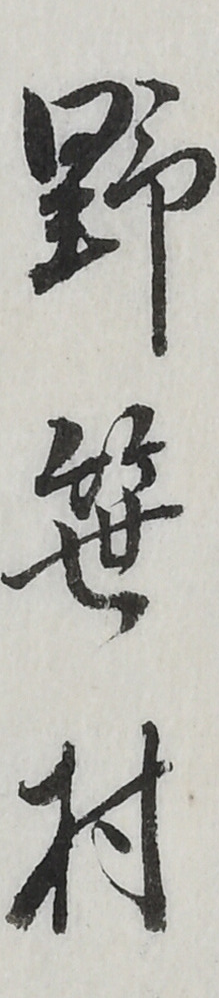野笹村
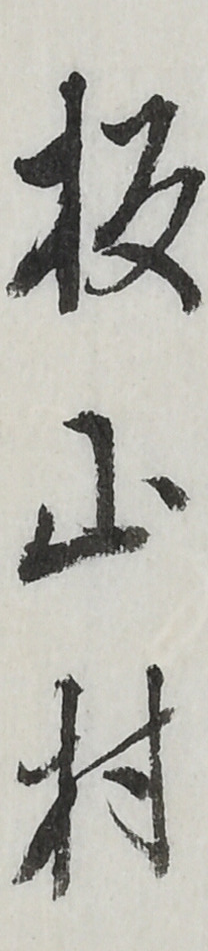板山村

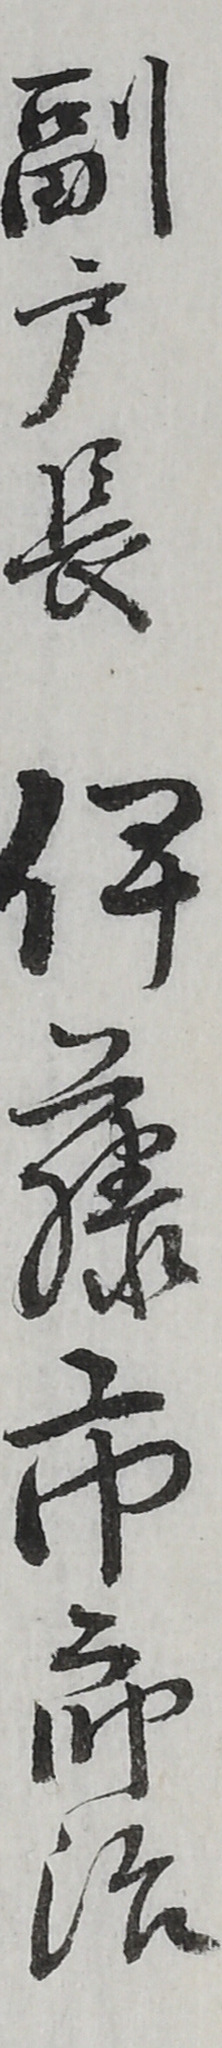副戸長伊藤市郎治
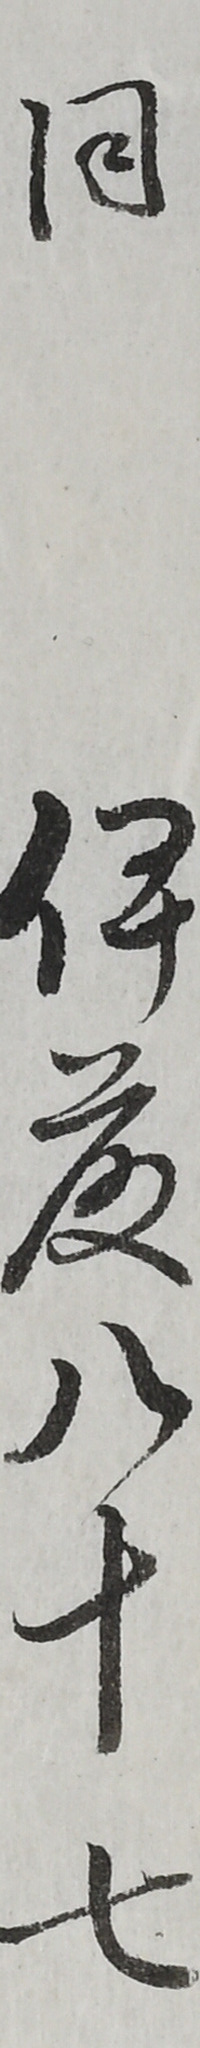同伊藤八十七
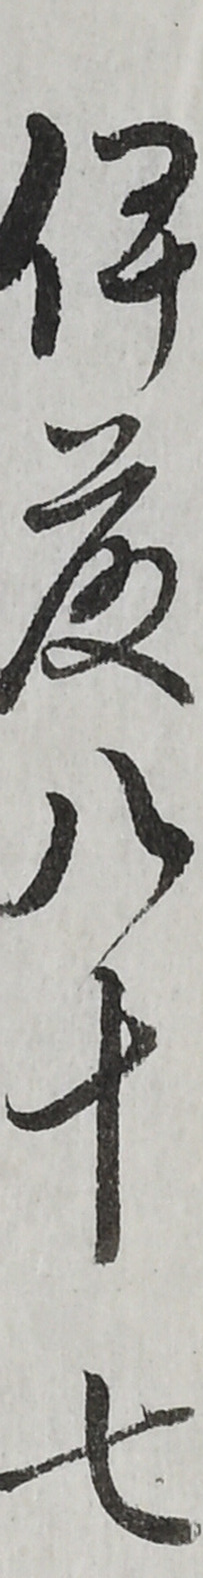同伊藤八十七
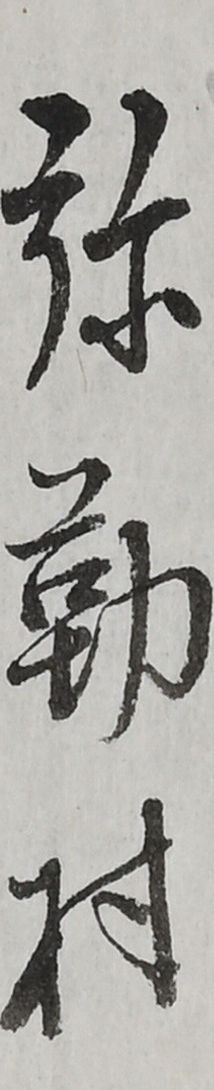弥勒村
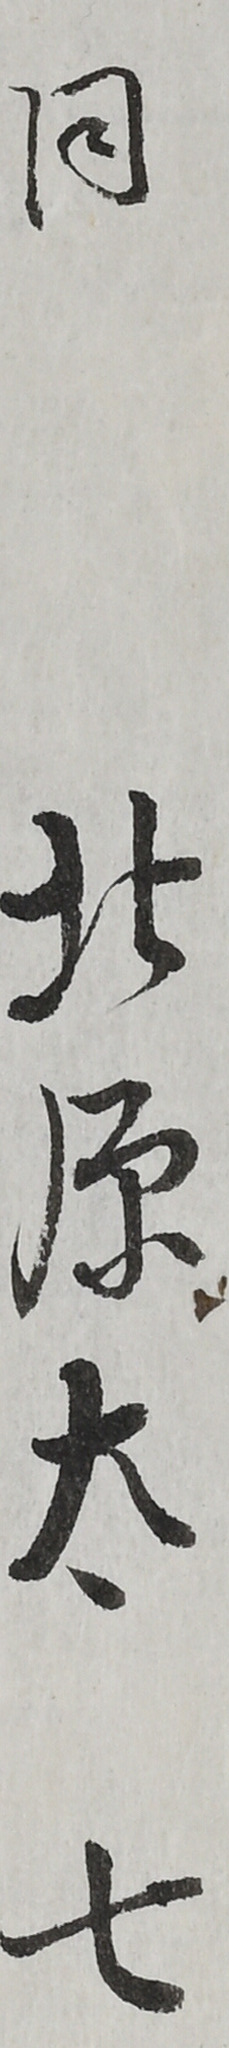同北原太七
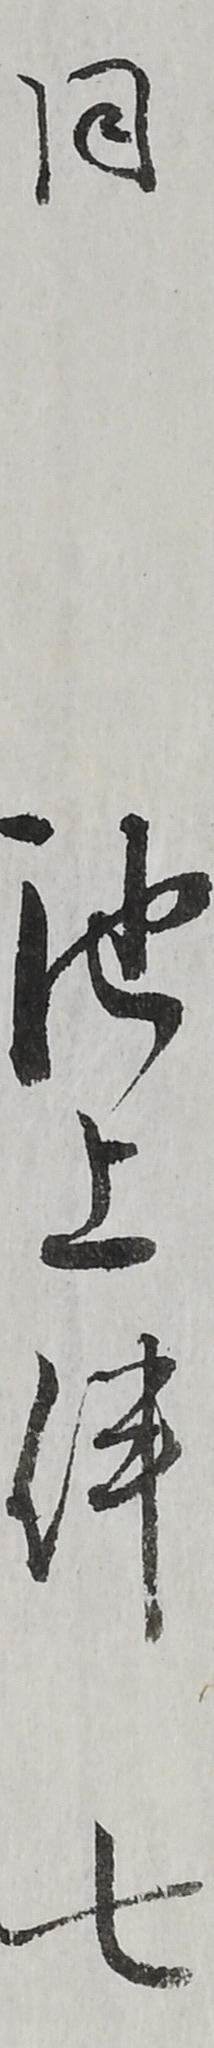同池上伴七
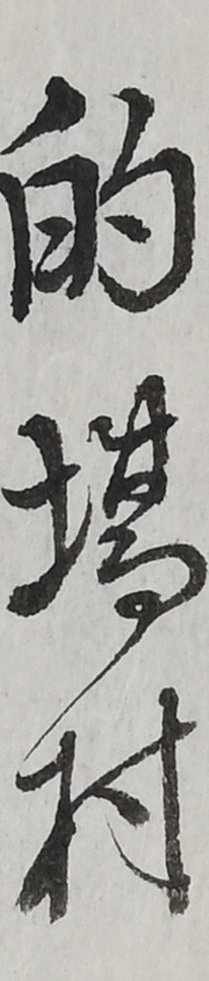的場村
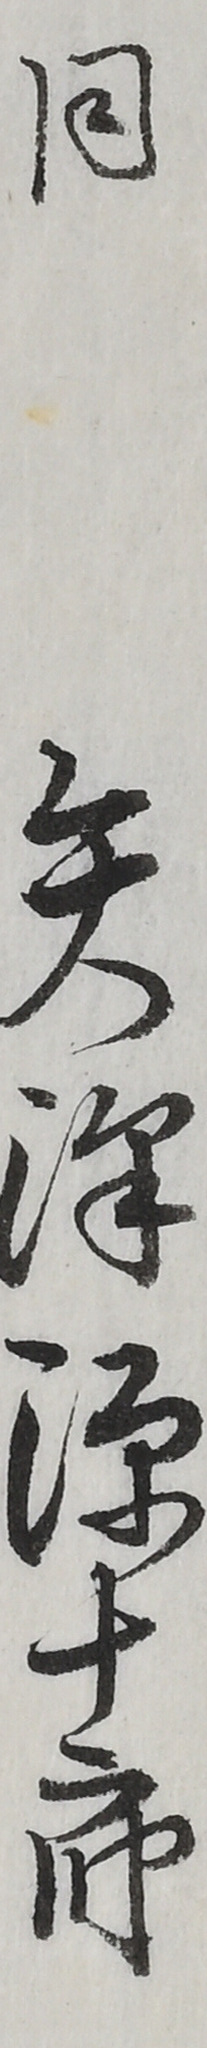同矢澤源十郎
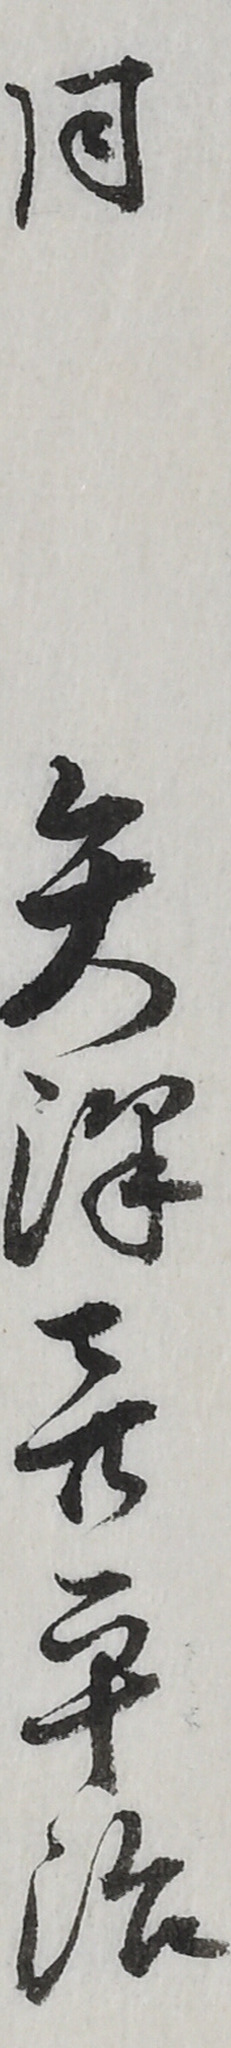同矢澤喜平治
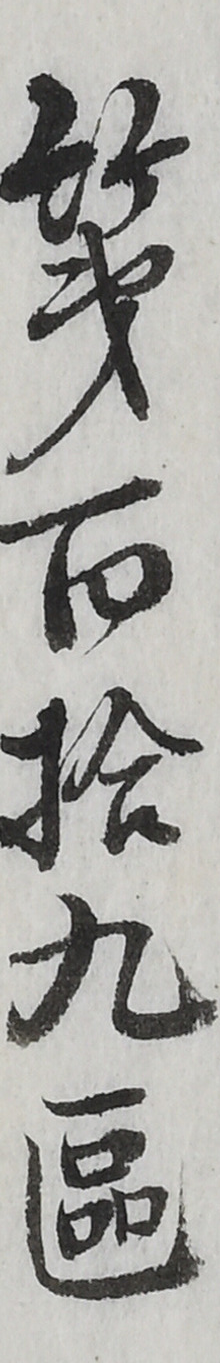第百拾九区
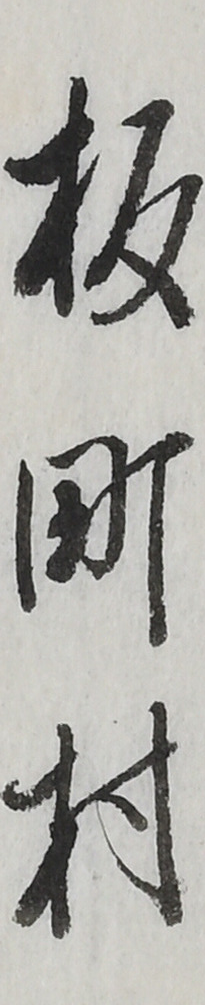板町村
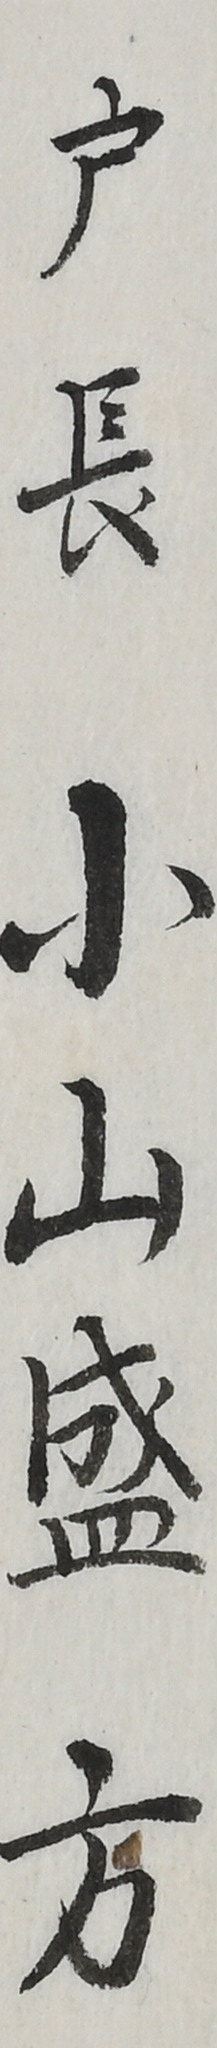戸長小山盛方
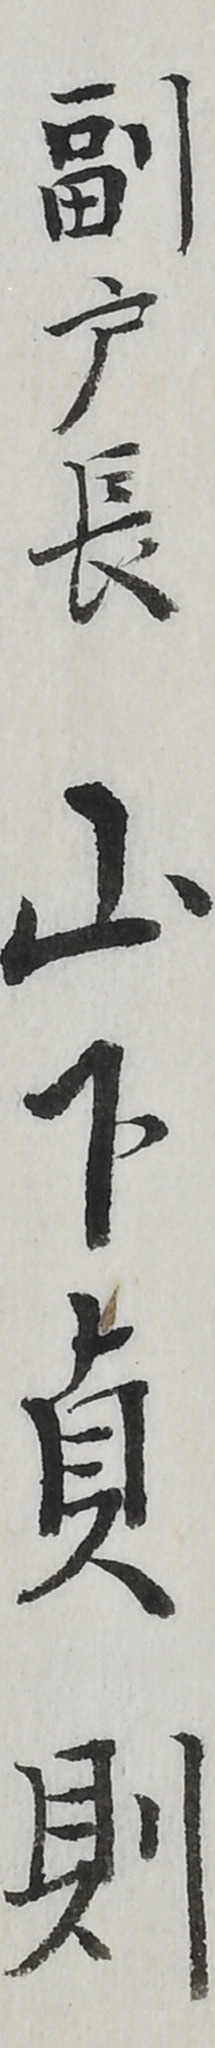副戸長山下貞則
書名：伊那郡毎村戸長副戸長名簿
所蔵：伊那市立高遠町図書館・合同会社AMANE
